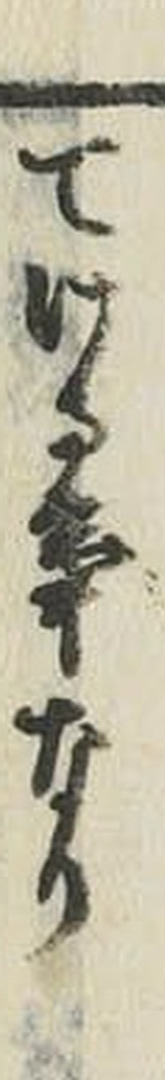てける事なり
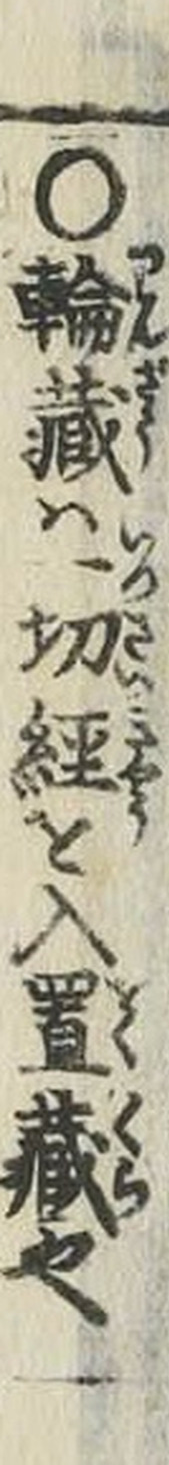○輪蔵は一切経を入置蔵也
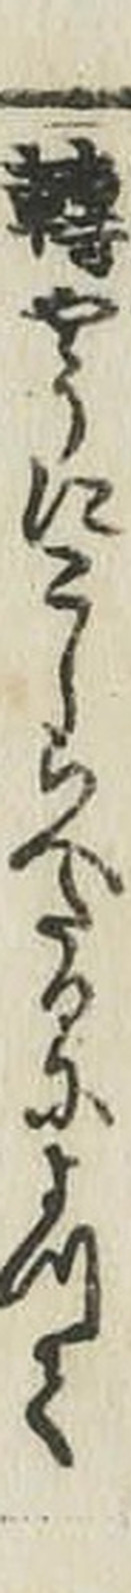転やうにこしらへたるによつて
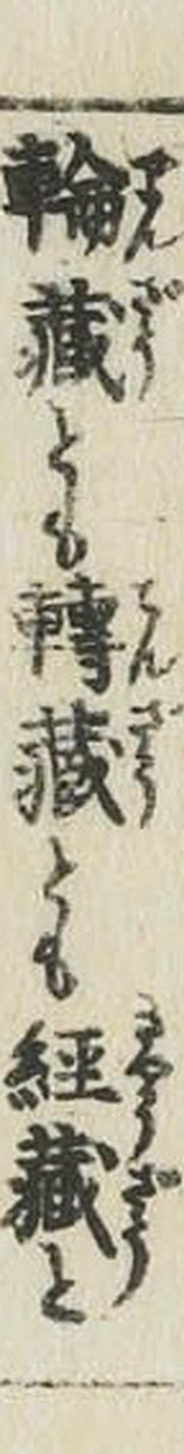輪蔵とも転蔵とも経蔵と
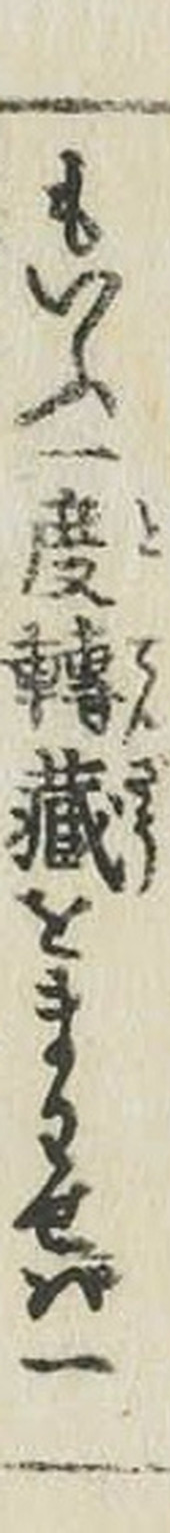もいふ一度転蔵をまわせば一
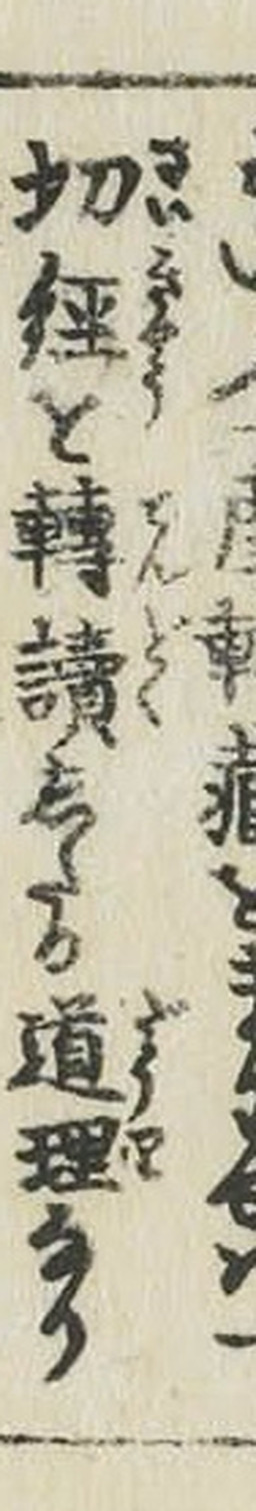切経を転読したる道理なり
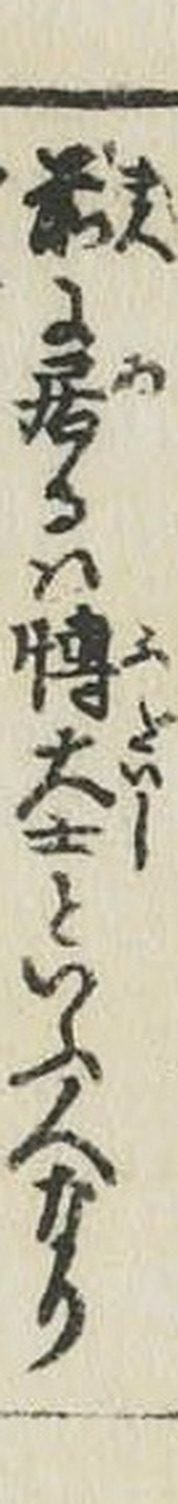前に居るは傅大士といふ人なり
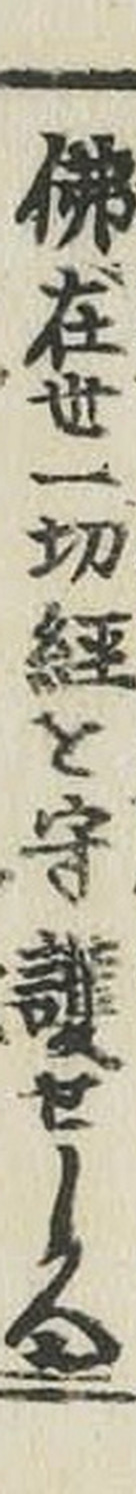仏在世一切経を守護せし人也
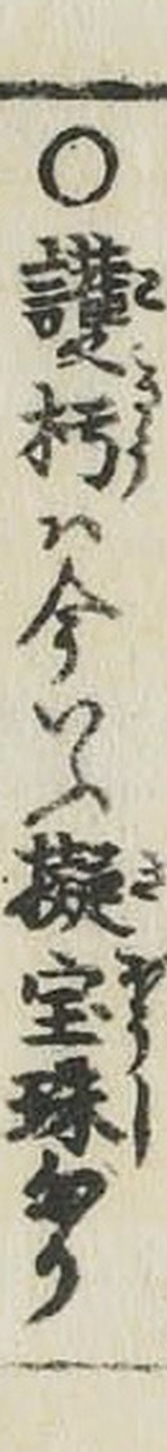○護朽は今いふ擬宝珠なり
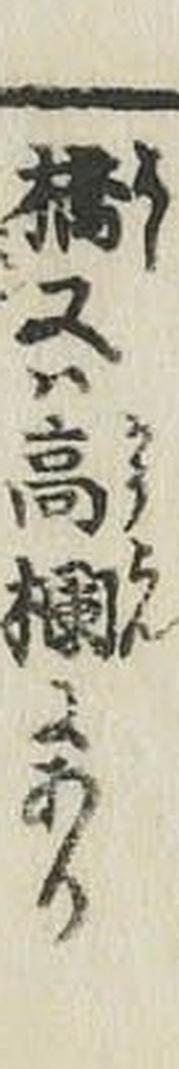橋又は高欄にあり
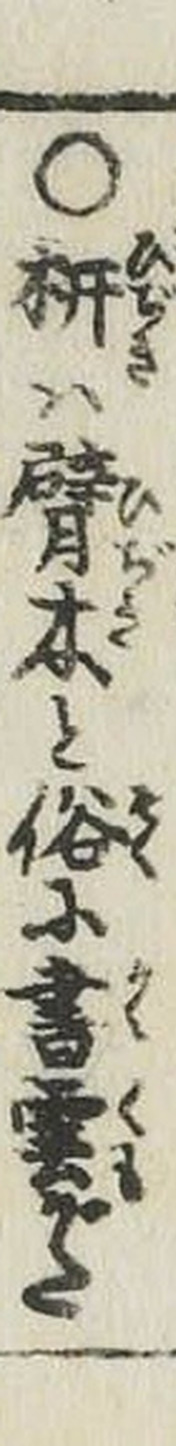○枅は臂木と俗に書雲がた
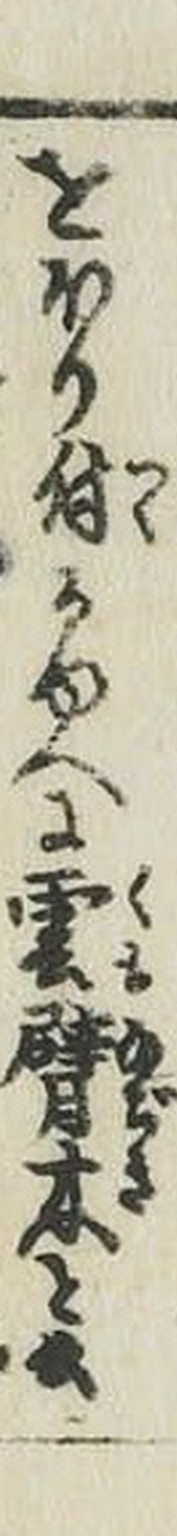をほり付るゆへに雲臂木と云
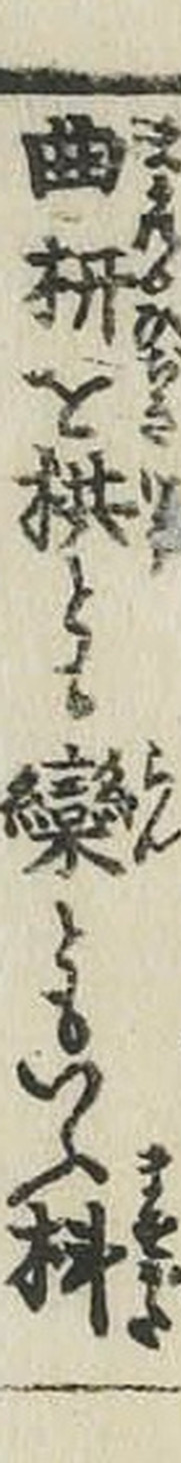曲枅を栱とも欒ともいふ枓
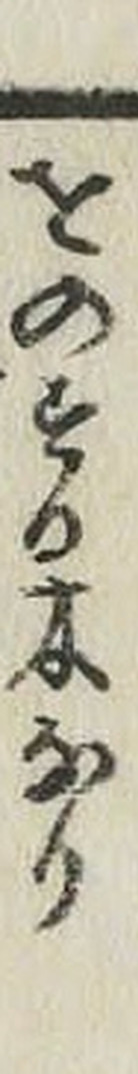をのする木なり
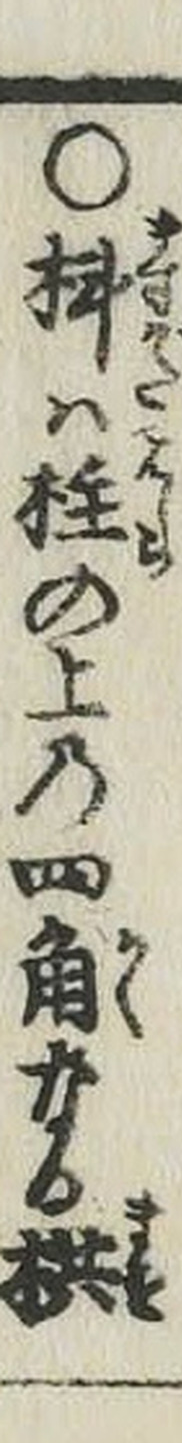○枓は柱の上の四角なる栱
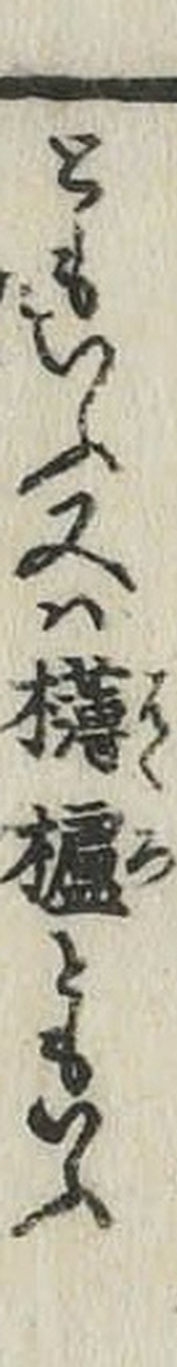ともいふ又は欂櫨ともいふ
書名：増補頭書訓蒙図彙大成 10巻 2:巻之1-3
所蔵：東京学芸大学教育コンテンツアーカイブ
